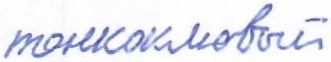тонкоклювый
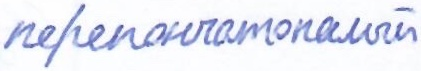перепончатопалый
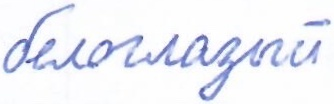белоглазый
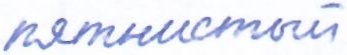пятнистый
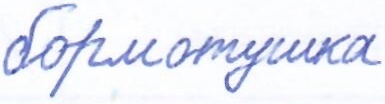бормотушка
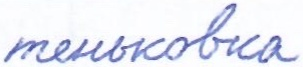теньковка
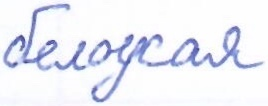белоусая
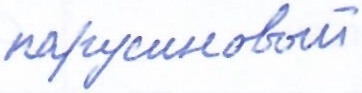парусиновый
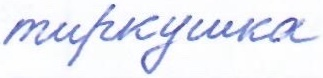тиркушка
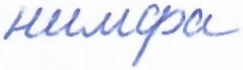нимфа
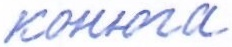конюга
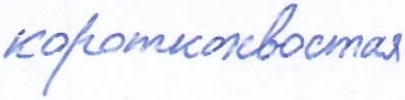короткохвостая
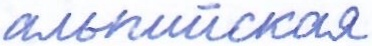альпийская
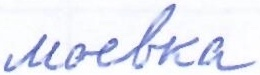моевка
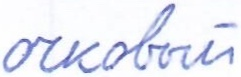очковый
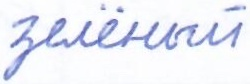зелёный
